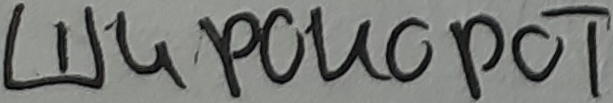широкорот
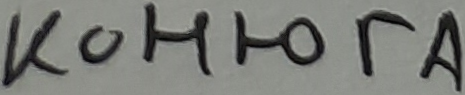конюга
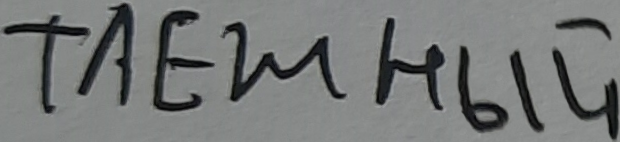тлежный
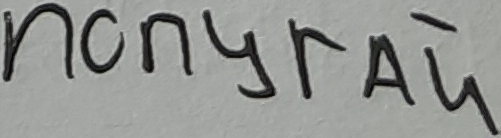попугай
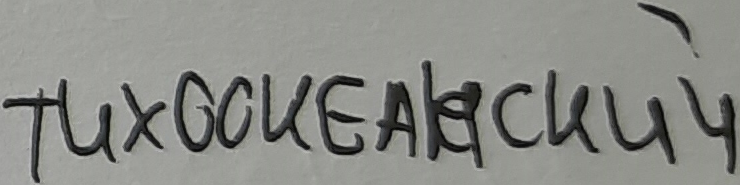тихоокеанский
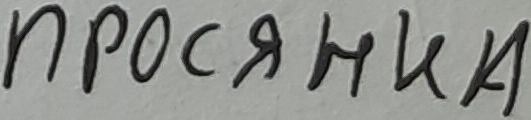просянка
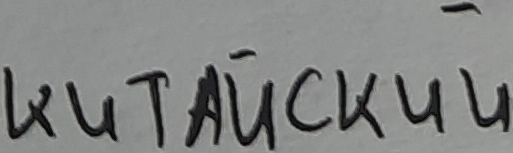китайский
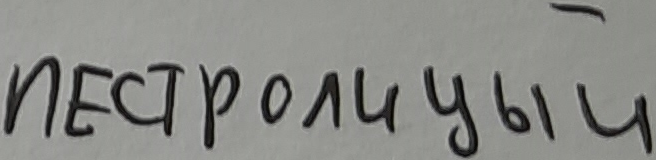пестролицый
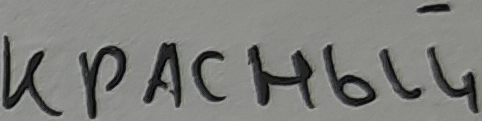красный
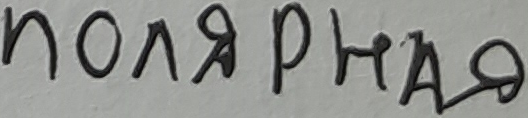полярная
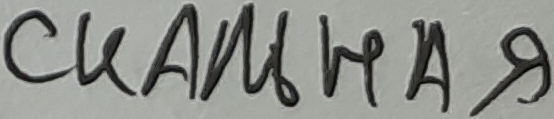скальная
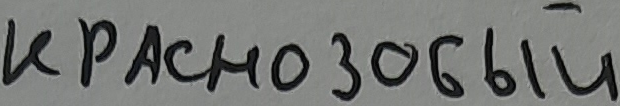краснозобый
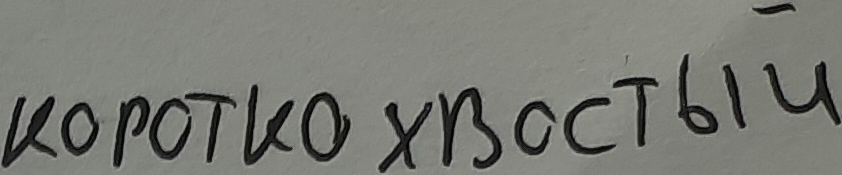короткохвостый
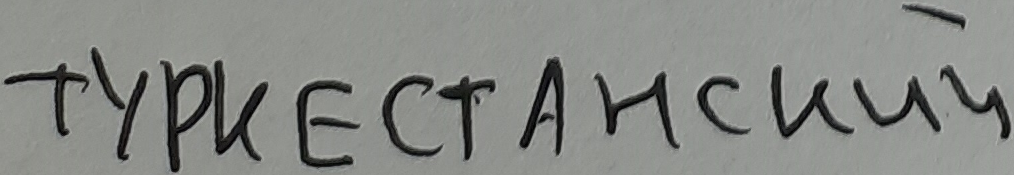туркестанский
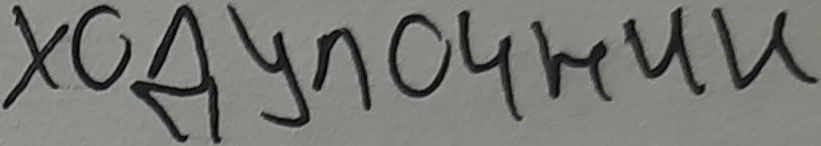ходулочник
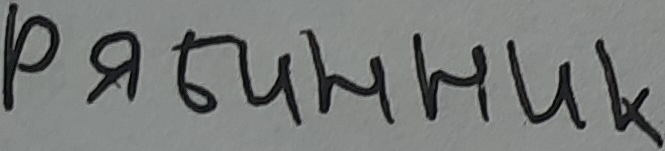рябинник
